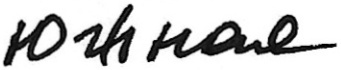южная
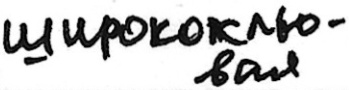ширококлю-вая
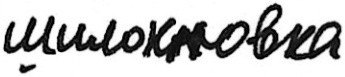шилоклювка
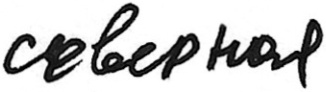северная
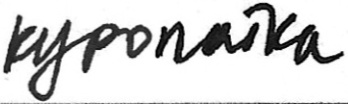куропатка
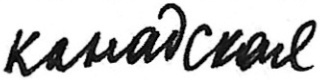канадская
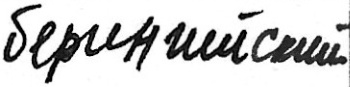берингийский
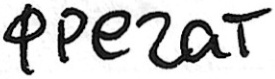фрегат
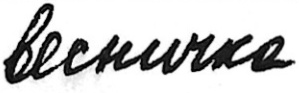весничка
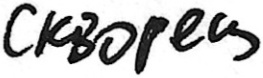скворец
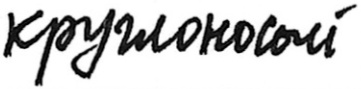круглоносый
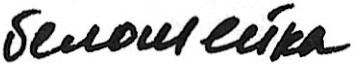белошейка
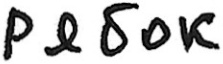рябок
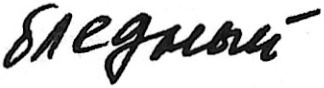бледный
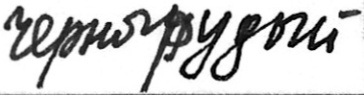черногрудый
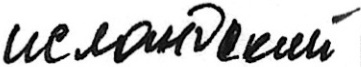исландский
